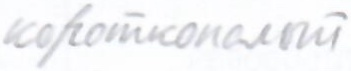короткопалый
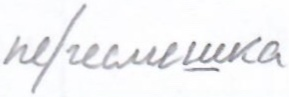пересмешка
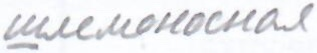шлемоносная
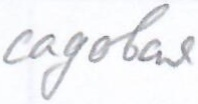садовая
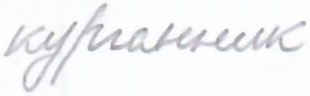курганник
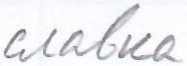славка
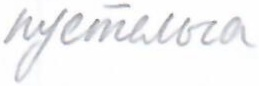пустельга
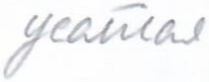усатая
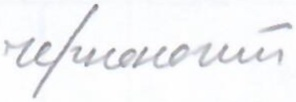черноногий
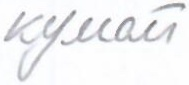кумай
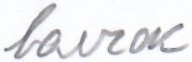волчок
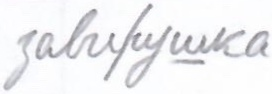завирушка
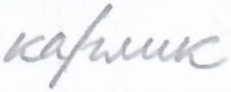карлик
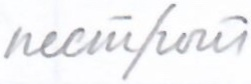пестрый
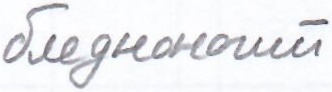бледноногий
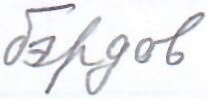бэрдов
